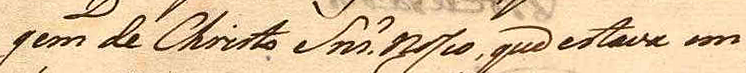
gem de Christo Snr̄. nosso, que estava em
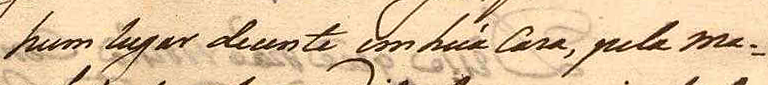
hum lugar decente em huā caza, pela ma
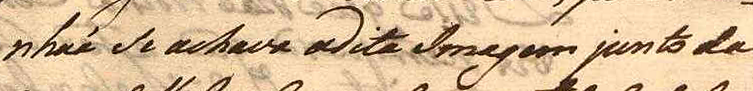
nhaã se achava a dita Imagem junto da
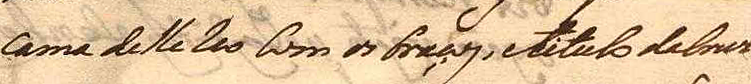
cama delle Reo Com os braços, e titulo da Crus
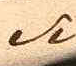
Se
